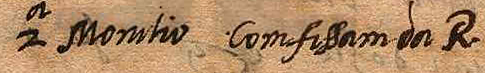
2ª Monitio Comfissam da R.
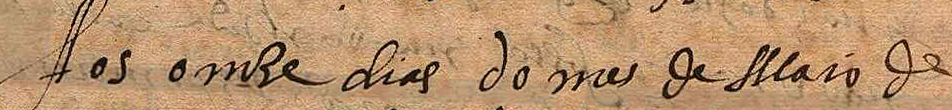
Aos omze dias do mes de Maio de
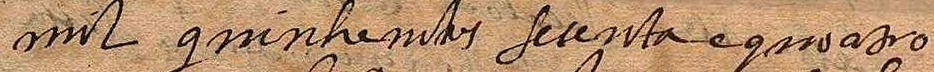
miL quinhemtos sesenta e quoatro
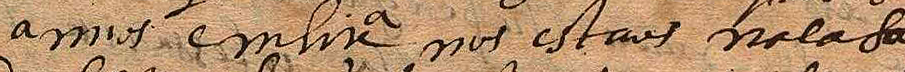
annos em lixa nos estaos na casa
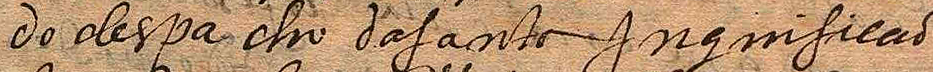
do despacho da santa Jnquisicaõ
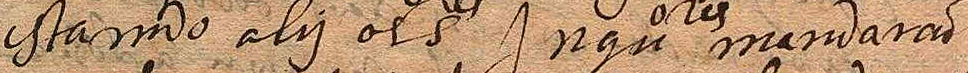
estamdo ahj os sres Jnquores mandaraõ
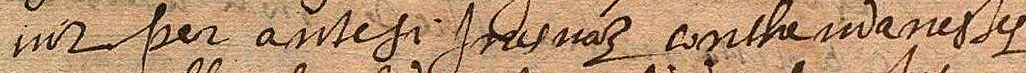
uir perante si Jnes uaz contheuda nestes
